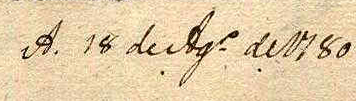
A. 18 de Ag.o de 1780.
